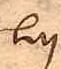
Lij
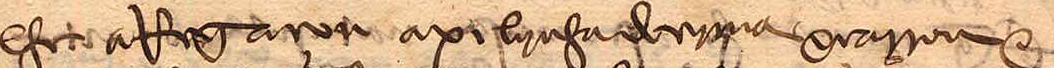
lhe aRegaçou a pelynha de cyma e çarrou e
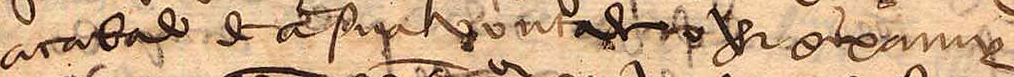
acabado de a sua vontade ꝟr e examy
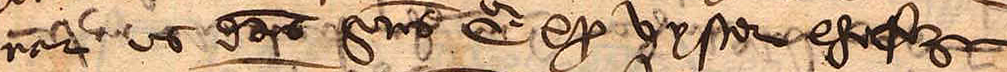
nar os dt̄os Sorẽs Cor e ꝓvyssor lhe feze
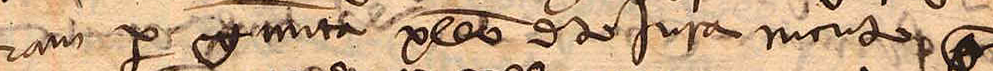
ram ꝑgunta p̄llo dto Juramento q̄ se
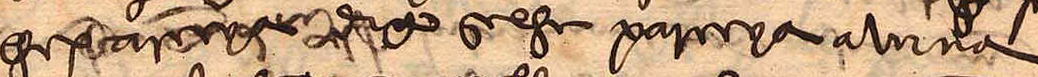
lhe parecya digo se lhe parecya aver na
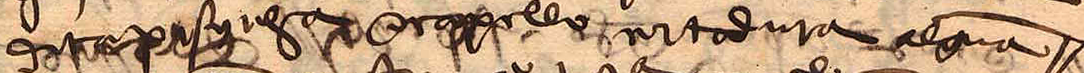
dita pisynha e capello cortadura alḡua //
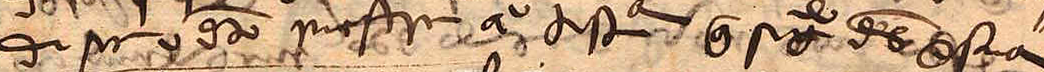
dise o dt̄o mestre ao testa q̄ segdo d̄s e sua
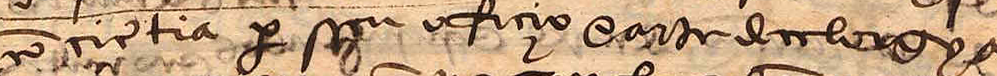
c̄ociētia ꝑ sseu ofiçio e arte de celorgya
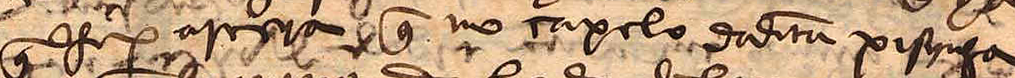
q̄ lhe parecya q̄ no capelo da dita pisynha
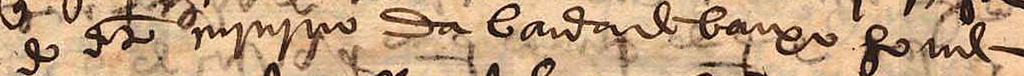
do dito mjnjno da banda de baixo honde
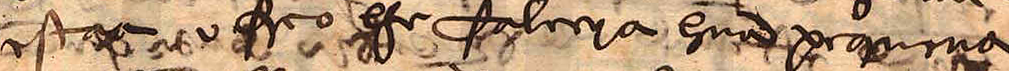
estaa o freo lhe falecya huā pequena
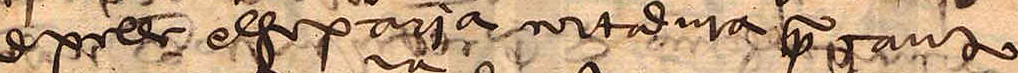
de pelle e lhe parja cortadura p̄oq̄anto
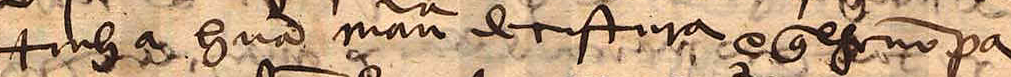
tinha huā manra de custura e q̄ lhe nō pa
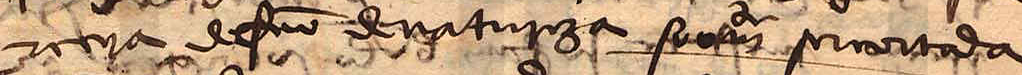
recya defc̄o de natureza soomte ser cortada
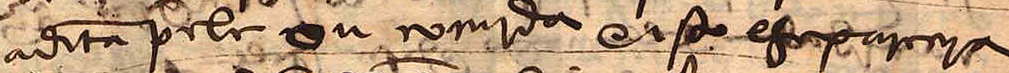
a dita pele ou comjda e isto lhe parecya
